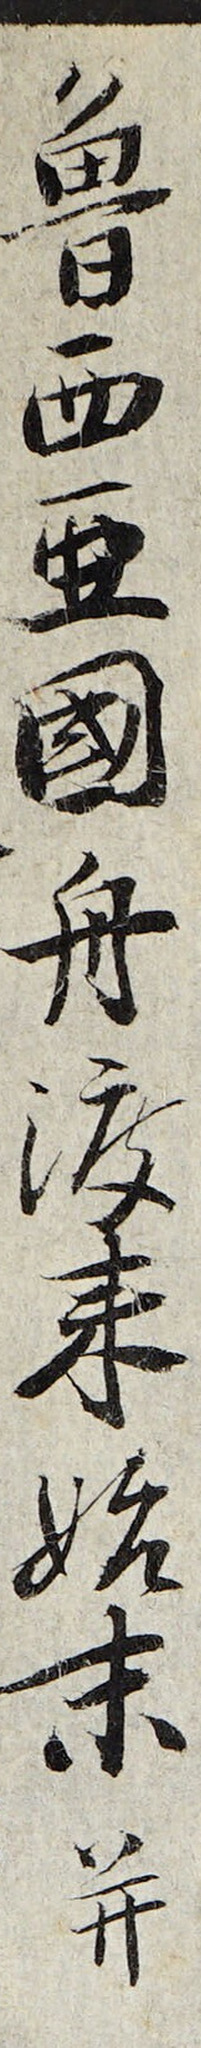魯西亜國舟渡来始末幷
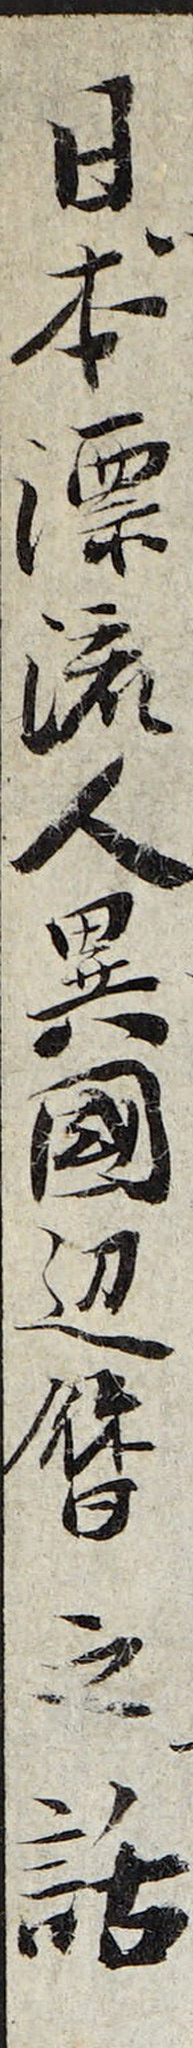日本漂流人異國辺暦之話

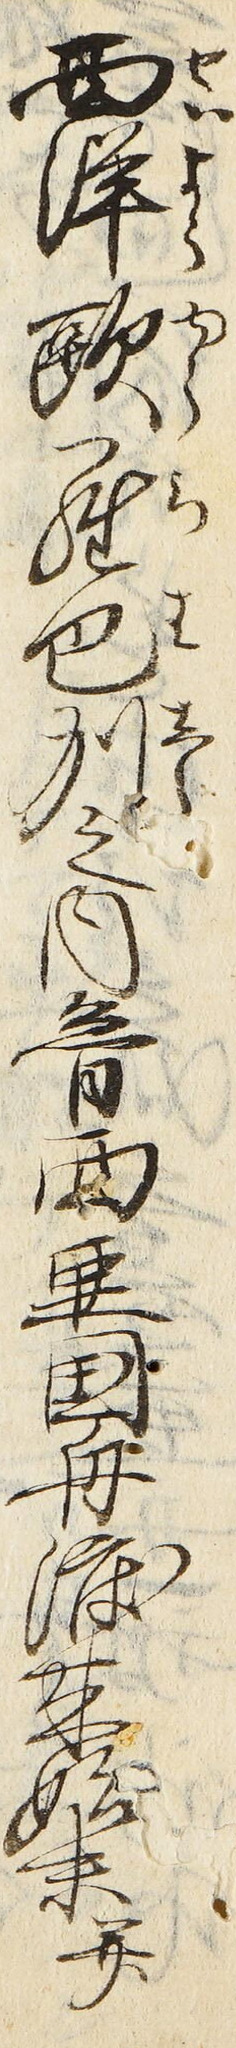西洋歐羅巴州之内魯西亜国舟渡来始末幷
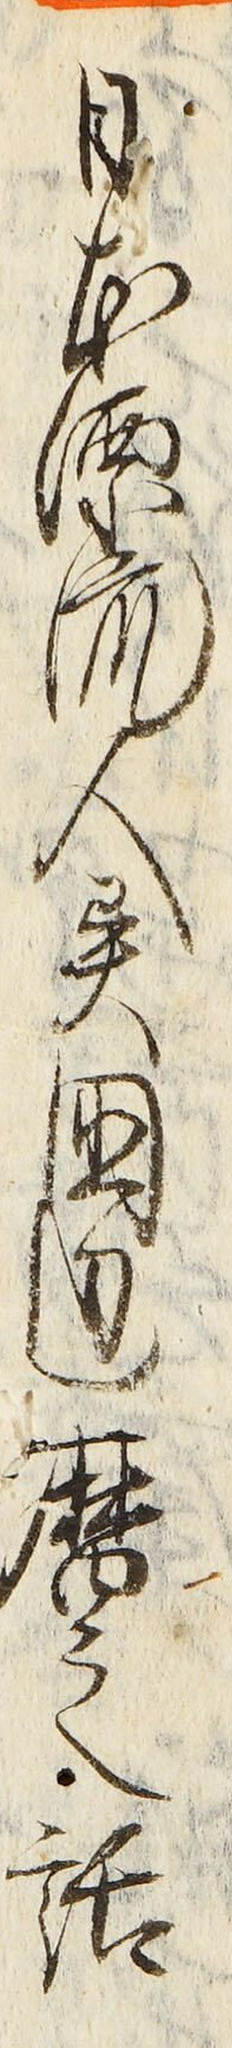日本漂流人異国辺暦之話
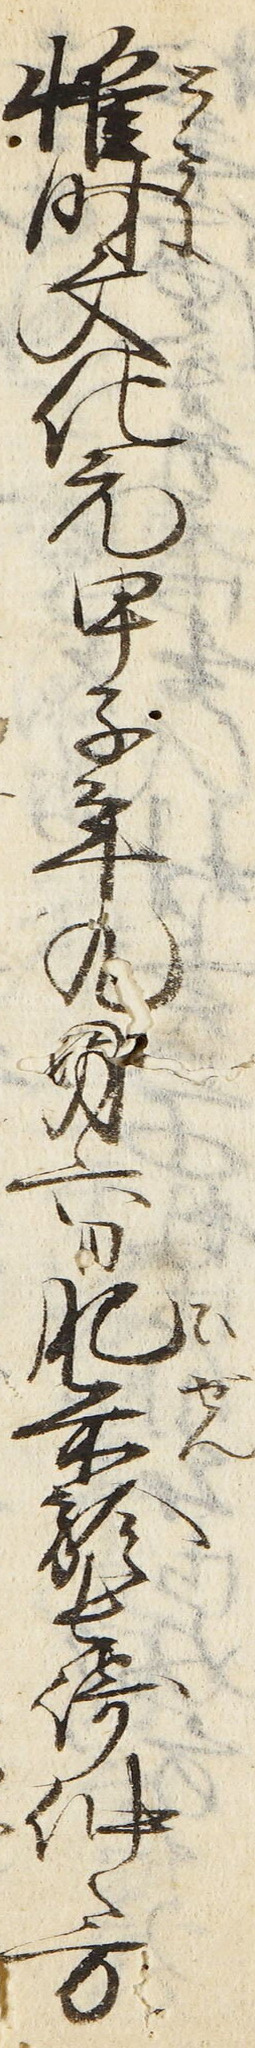惟時文化元甲子年九月六日肥前領長崎沖之方
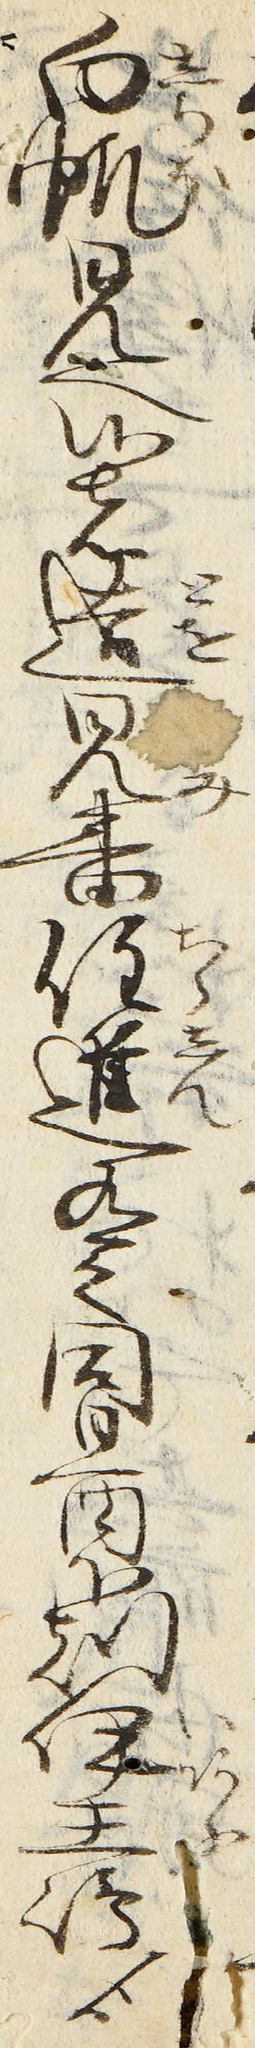白帆見へ候者遠見番注進有之同日酉下刻伊王嶋ゟ
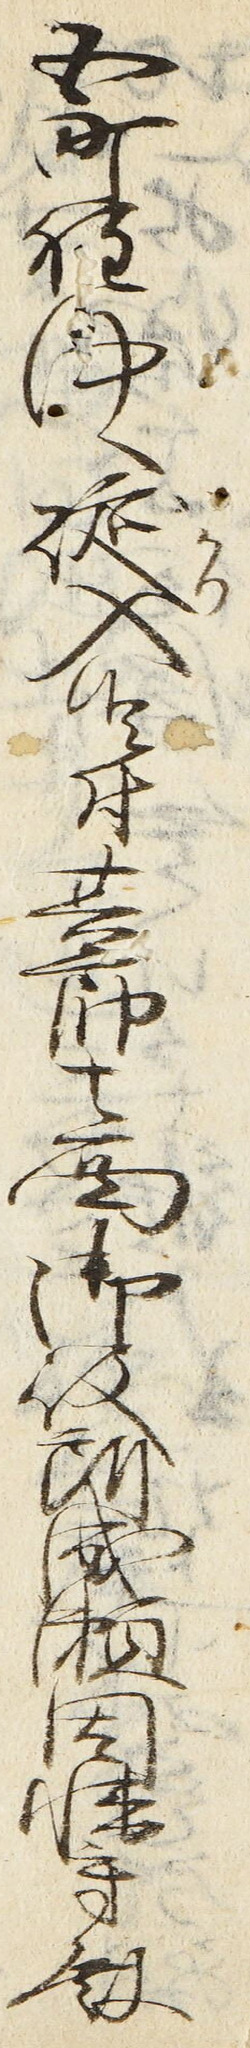五町程沖へ碇入候に付其節者西御役所成瀬因幡守殿
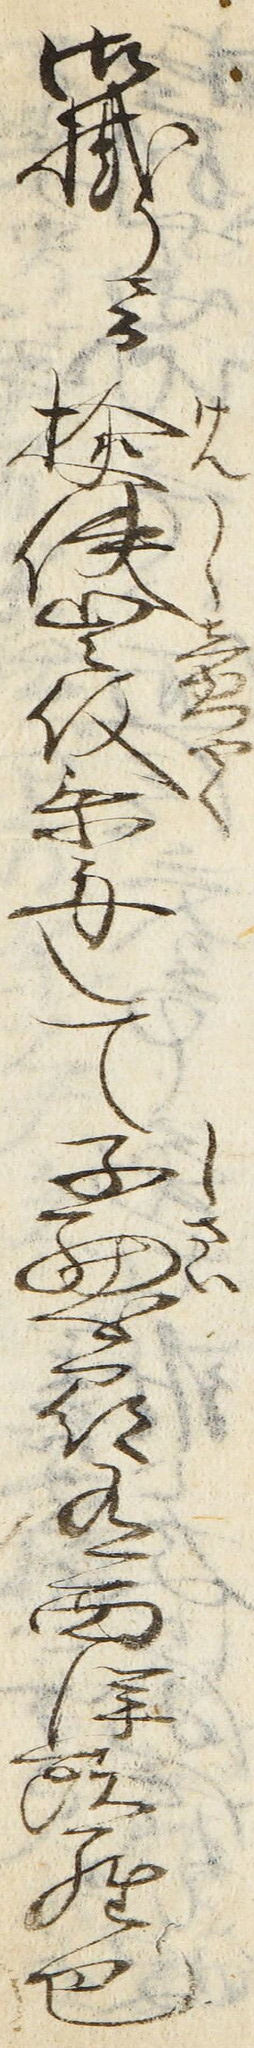御掛りに而検使出役乗舟して子細を罷有西洋歐羅巴
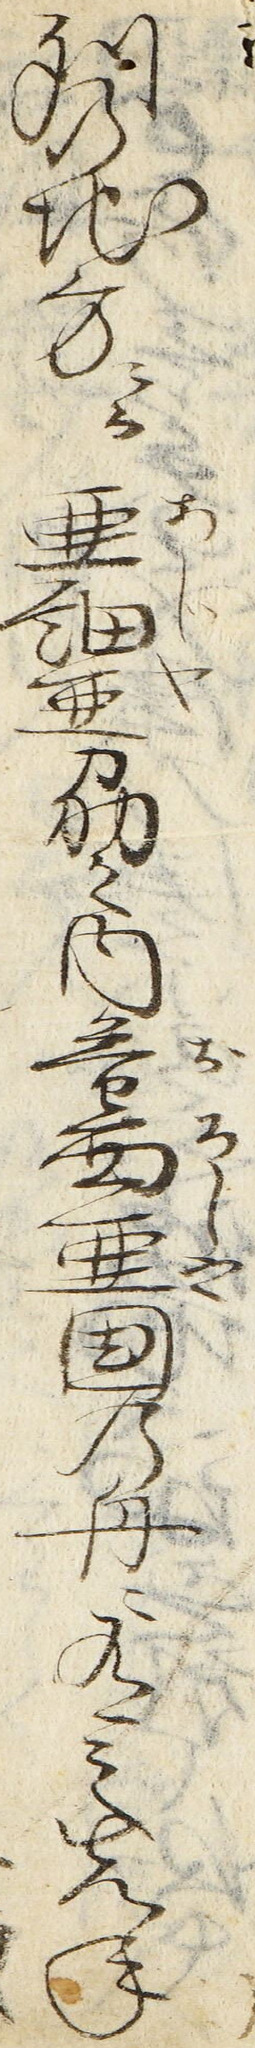州乃地方に而亜細亜州之内魯西亜国乃舟に有之先手
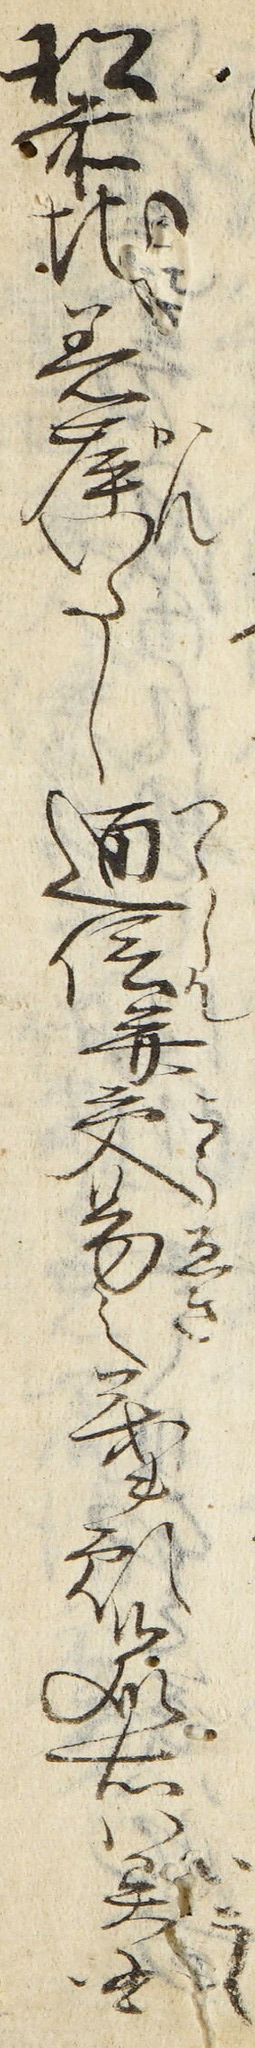松前地に着岸いたし通信幷交易し義を願候処右は異国

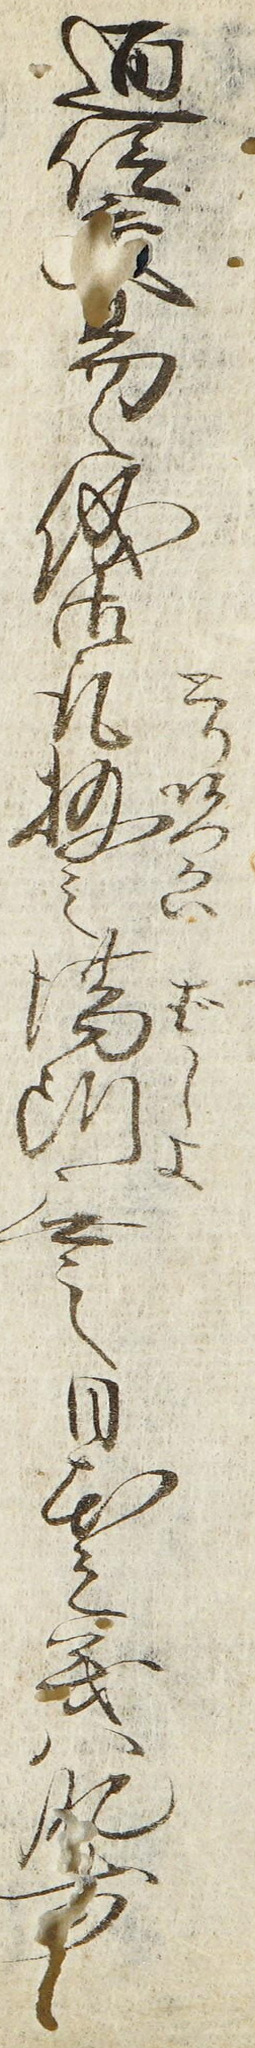通信交易之儀御取扱之場所無之日本之義は肥前
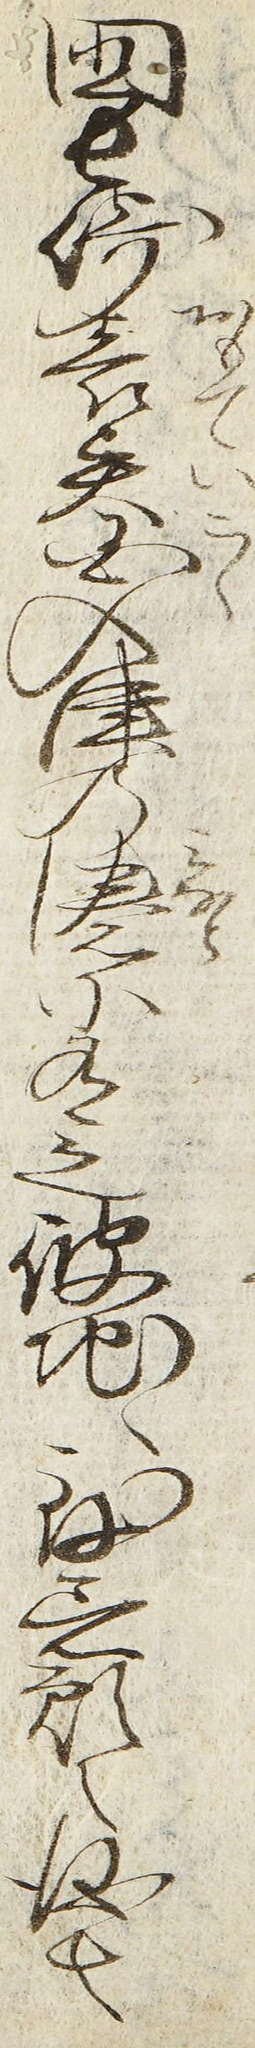國長崎表異国入津乃湊尓有之彼地へ致差願之儀者
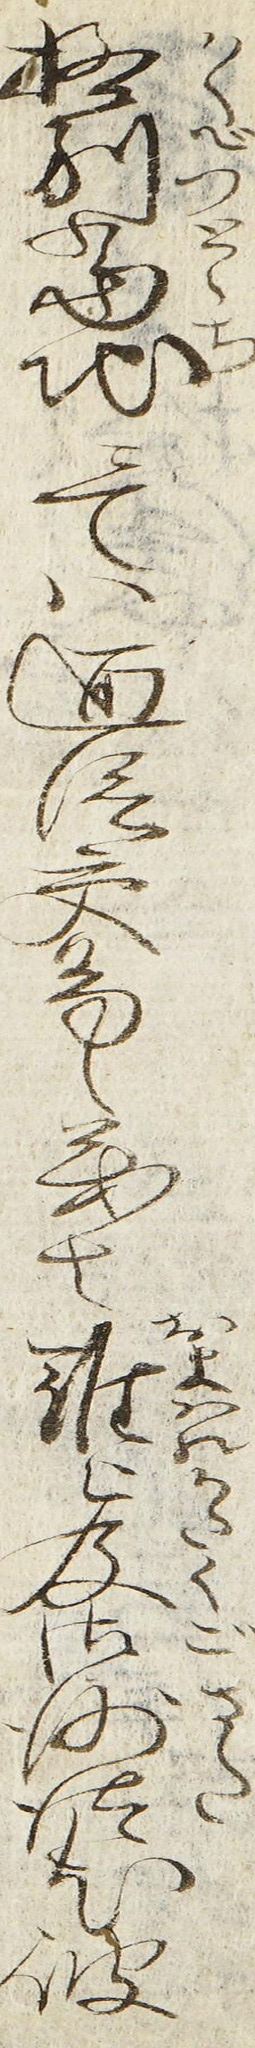格別当地にては通信交易之義者難被及御沙汰尤彼
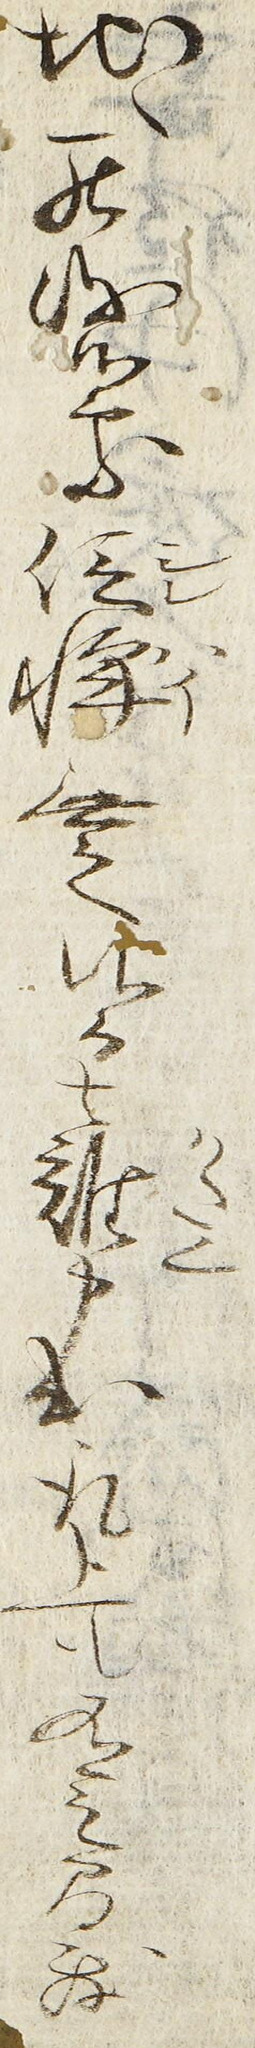地へ罷改候處信牌無之候而者難申出取上も有之間敷
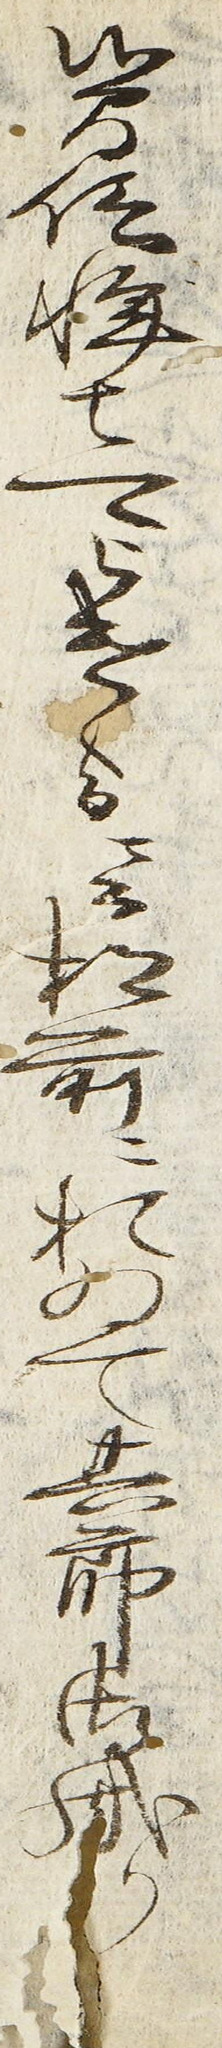候間信牌者可被遣旨に而松前に於ゐて其節御成り
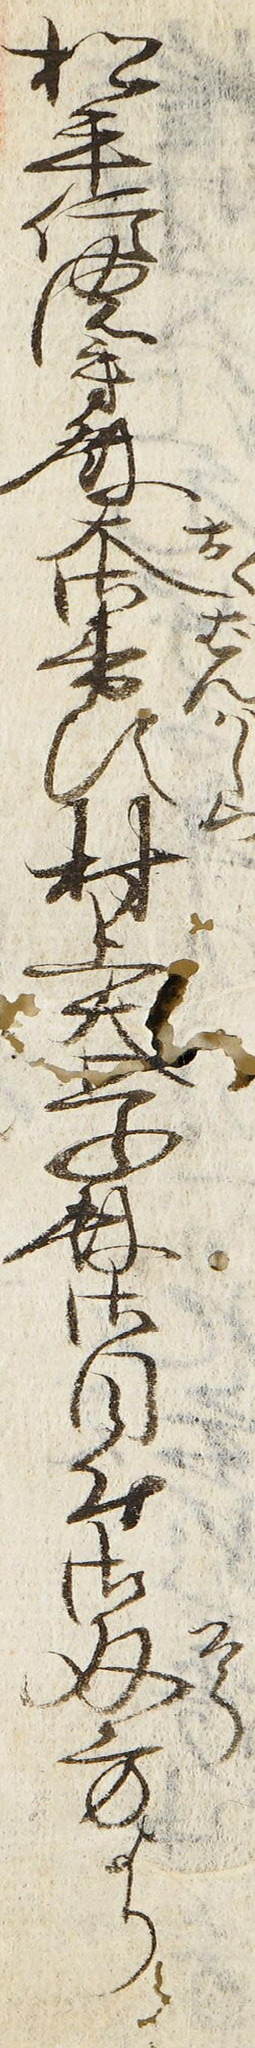松平信濃守殿大番頭村上大学林御目付御双方より
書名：魯西亜国舟渡来始末并日本流漂人異国遍歴之話（西洋欧羅巴州之内一）
